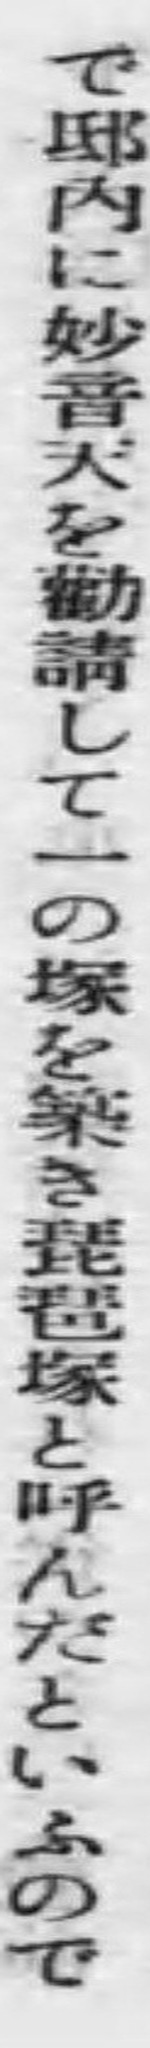で邸内に妙音天を勧請して一の塚を築き琵琶塚と呼んだといふので
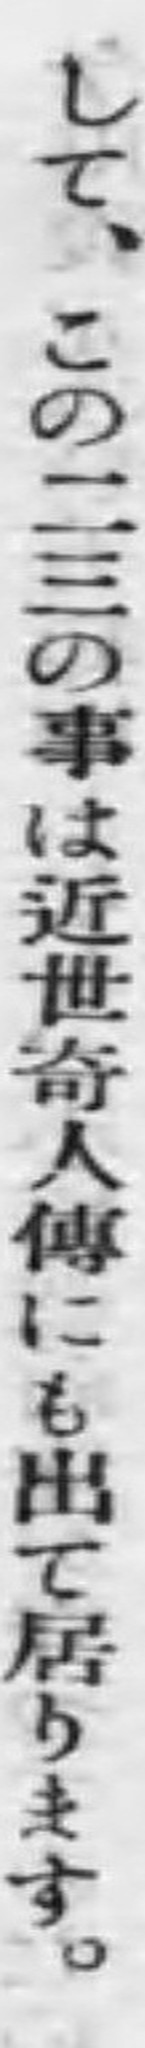して、この二三の事は近世奇人伝にも出て居ります。
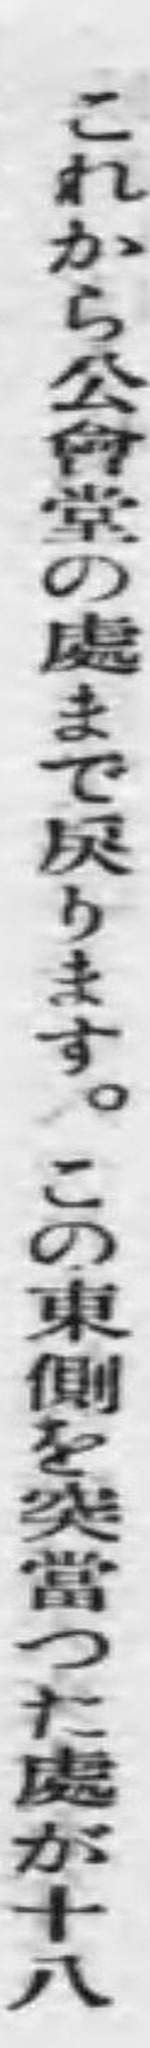これから公会堂の処まで戻ります。この東側を突当つた処が十八
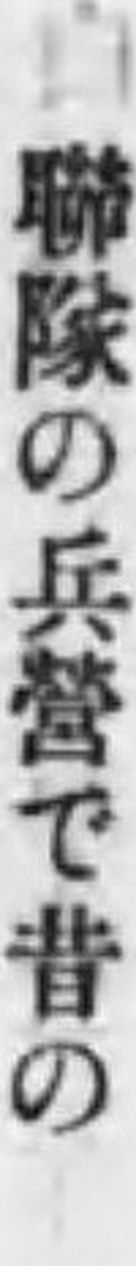聯隊の兵営で昔の
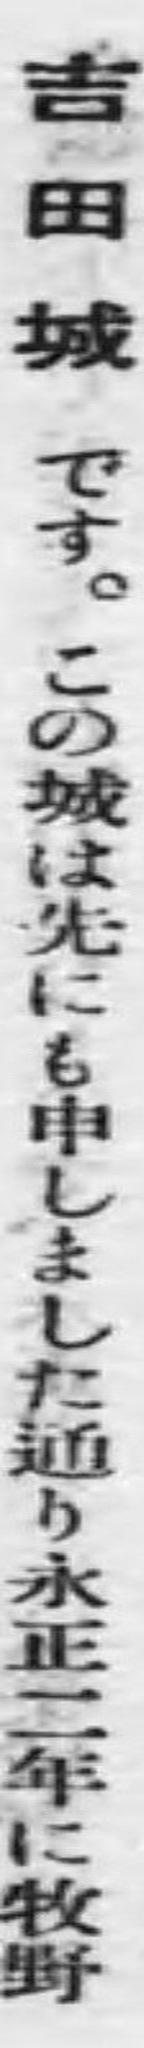吉田城です。この城は先にも申しました通り永正二年に牧野
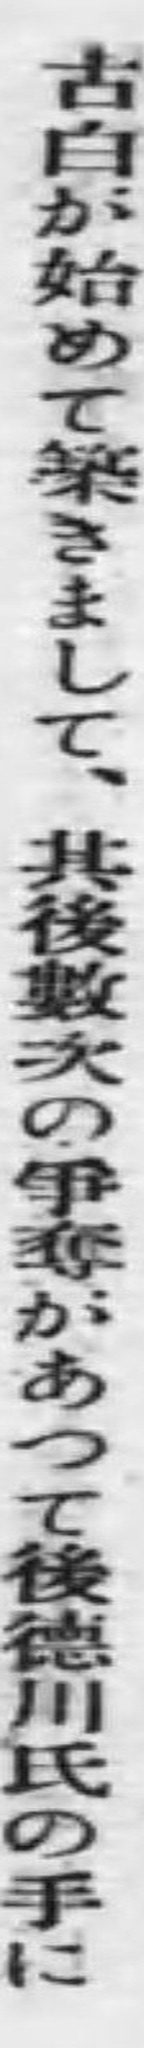古白が始めて築きまして、其後数次の争奪があつて後徳川氏の手に
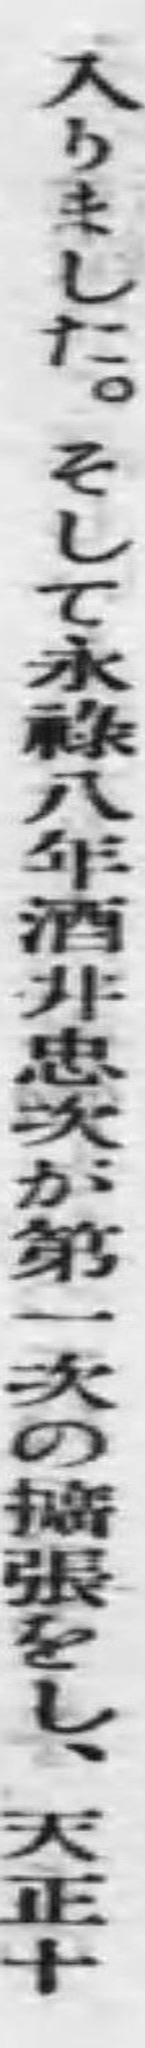入りました。そして永禄八年酒井忠次が第一次の拡張をし、天正十
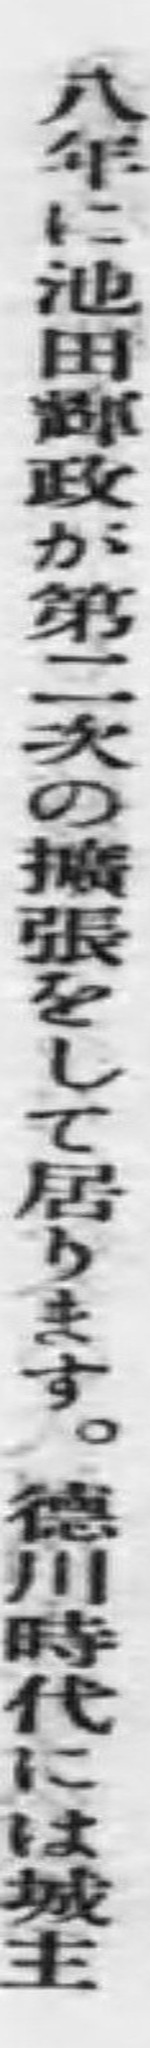八年に池田輝政が第二次の拡張をして居ります。德川時代には城主

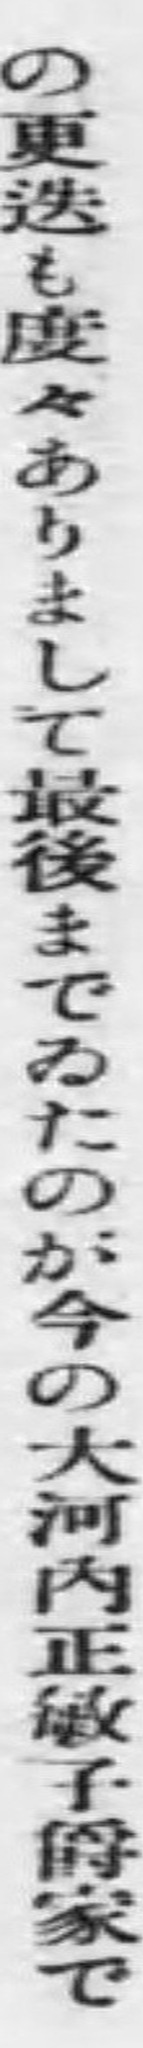の更迭も度々ありまして最後までゐたのが今の大河内正敏子爵家で
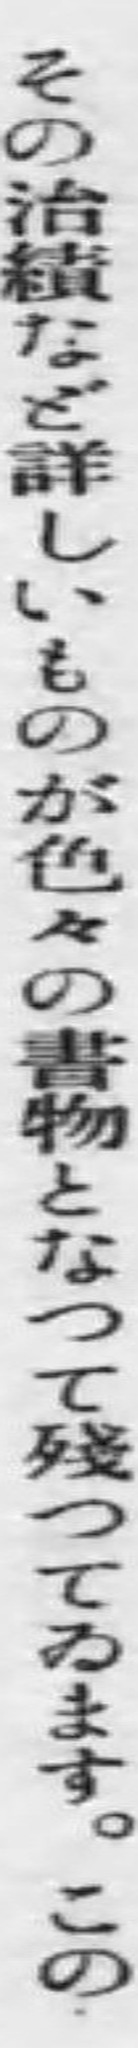その治績など詳しいものが色々の書物となつて残つてゐます。この
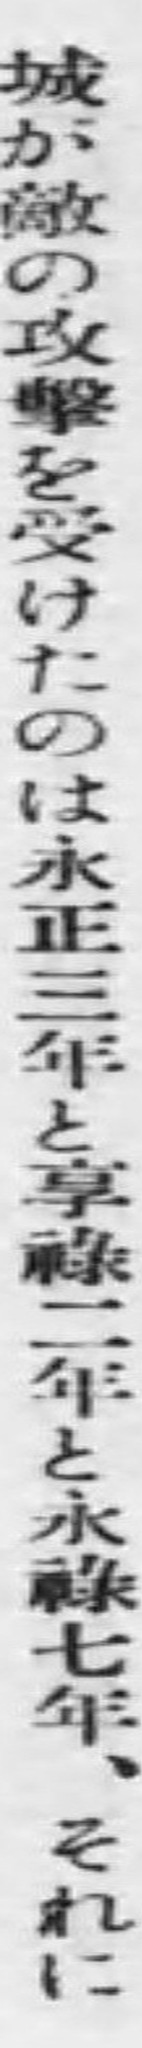城が敵の攻撃を受けたのは永正三年と享禄二年と永禄七年、それに
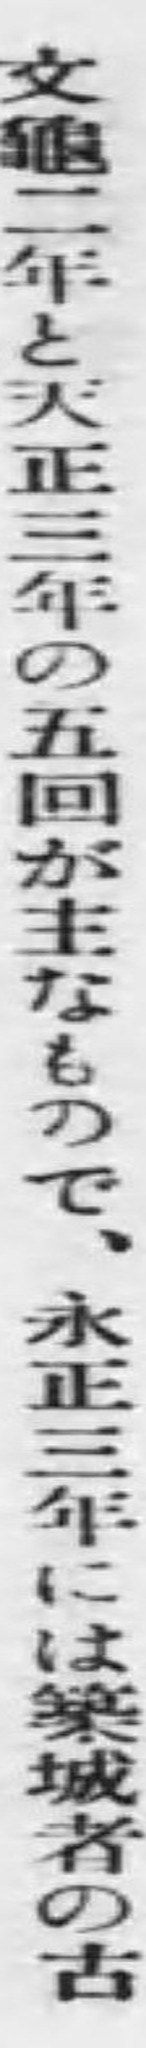文亀二年と天正三年の五回が主なもので、永正三年には築城者の古
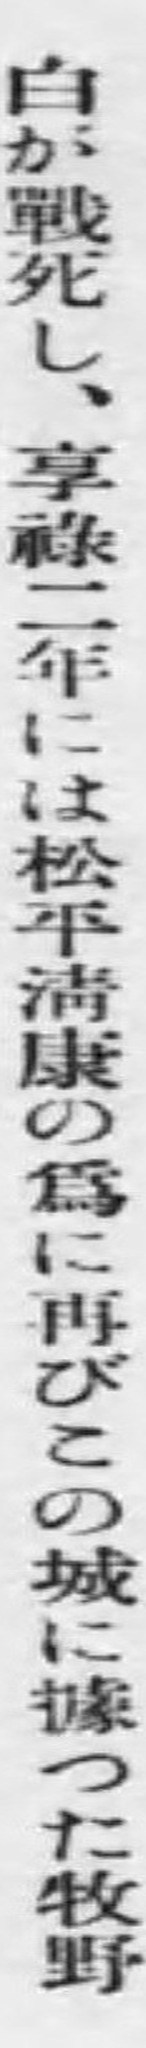白が戦死し、享禄二年には松平清康の為に再びこの城に拠つた牧野
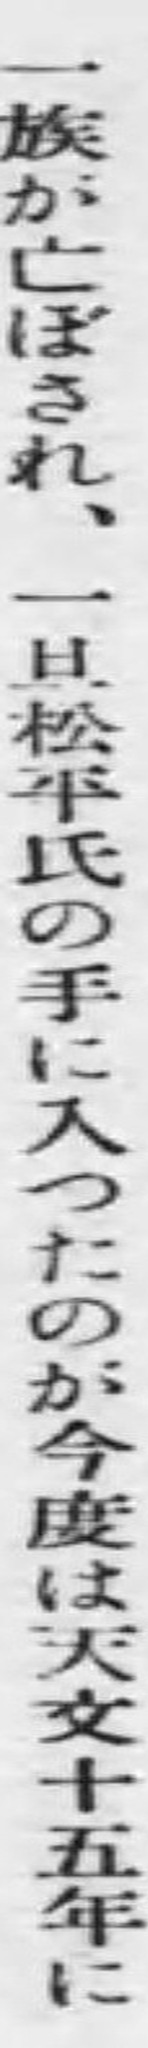一族が亡ぼされ、一旦松平氏の手に入つたのが今度は天文十五年に
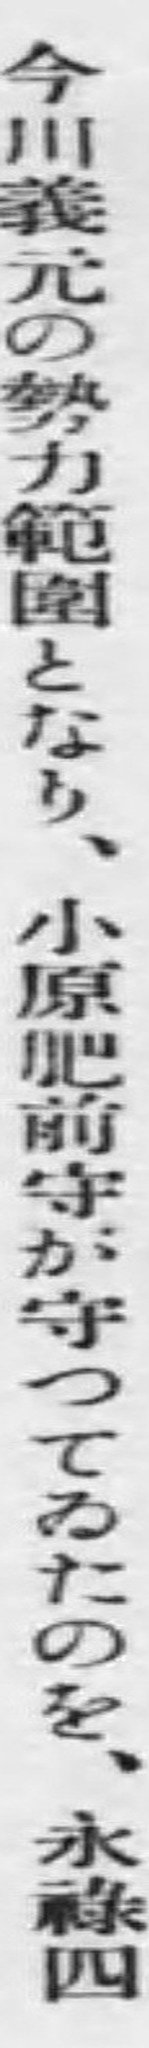今川義元の勢力範囲となり、小原肥前守が守つてゐたのを、永禄四
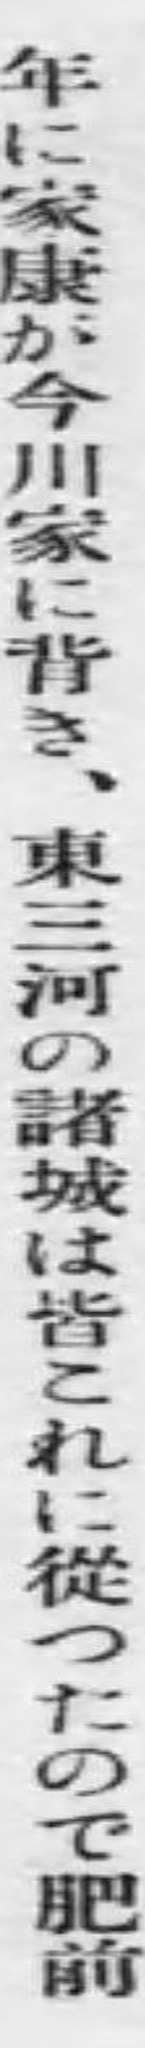年に家康が今川家に背き、東三河の諸城は皆これに従つたので肥前
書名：東三河道中記 : 豊橋市及其附近案内
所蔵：国立国会図書館 National Diet Library, JAPAN
